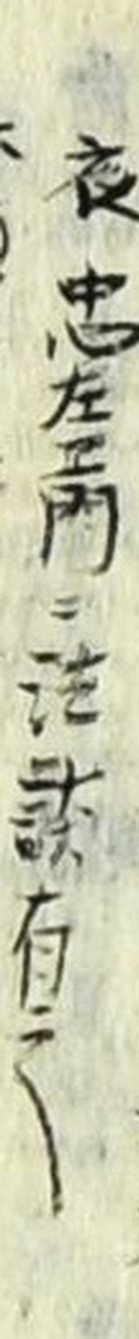夜忠左ヱ門に法談有之
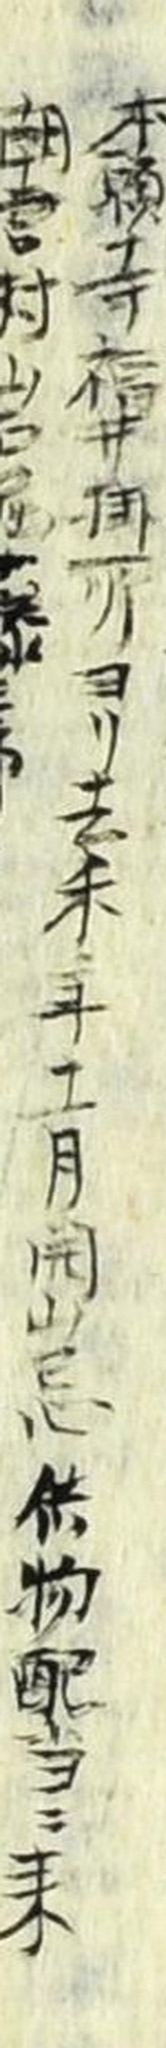本願寺福井掛所ヨリ去未年十一月開山忌供物配当ニ来
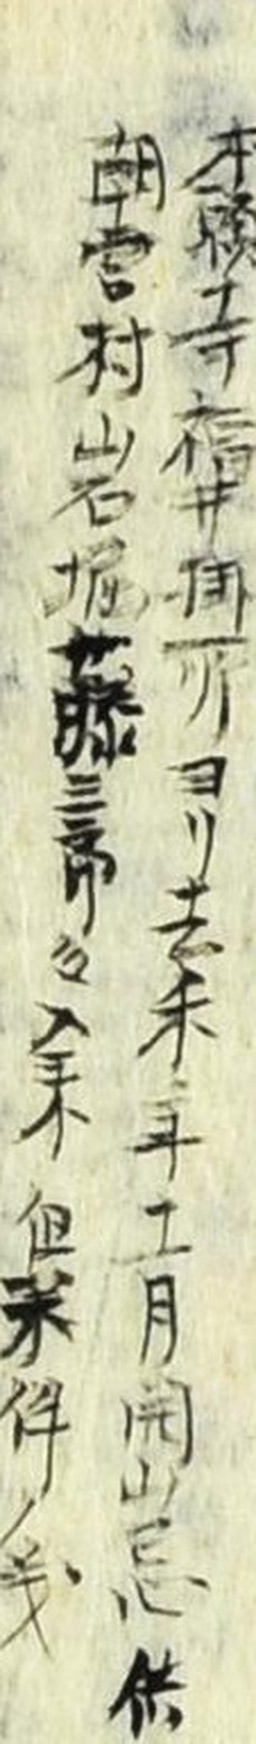朝宮村岩堀藤三郎殿入来但米件ノ義
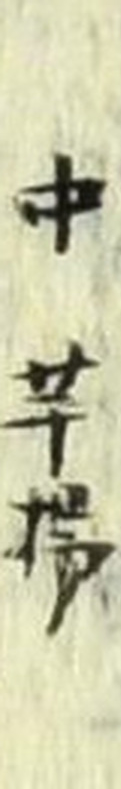中芋揚
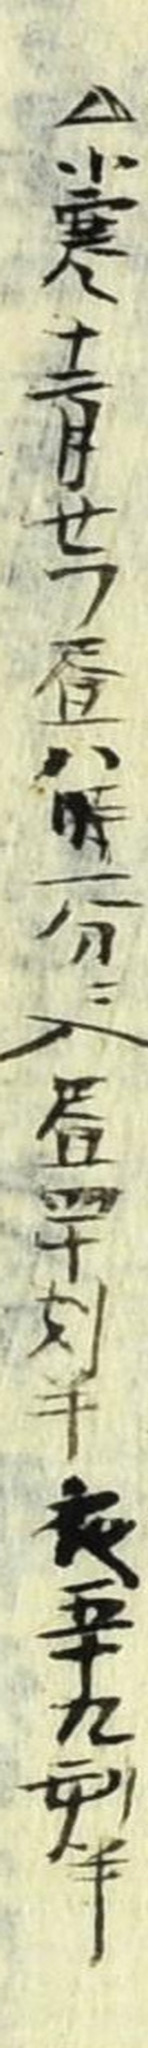△小寒十二月せつ昼八時一分ニ入昼四十刻半夜五十九刻半
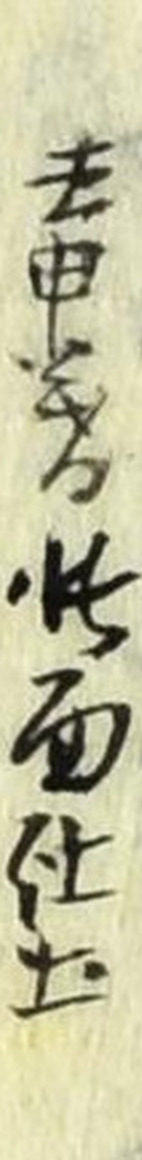去申暮帳面仕出
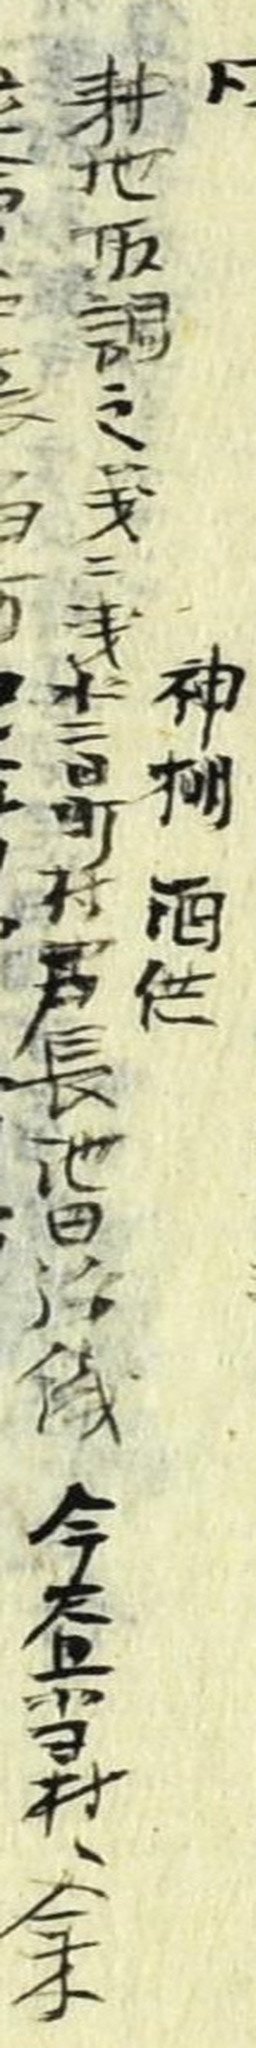耕地取調之義ニ浅水二日町村戸長池田弥織今昼当村へ入来
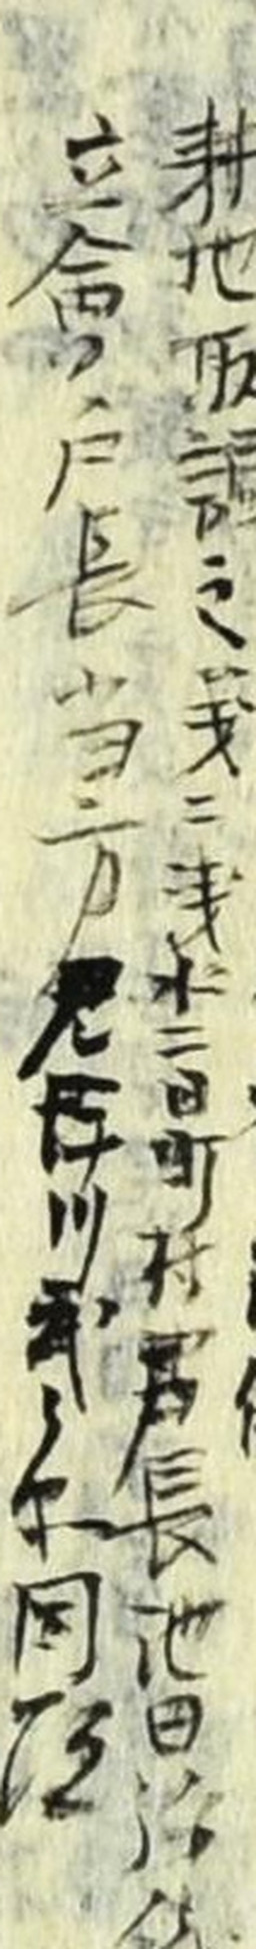立会戸長当方兄坪川武兵衛同道
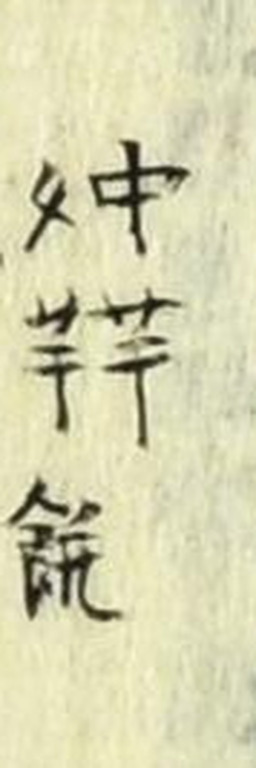中芋揚
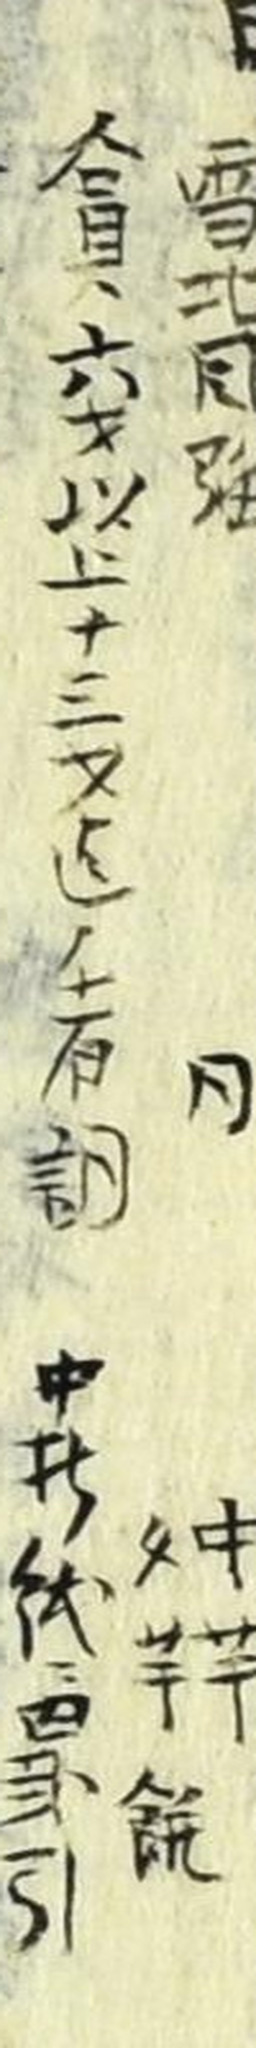人員六才以上十三才迄ノ者調中折紙ニ罫引
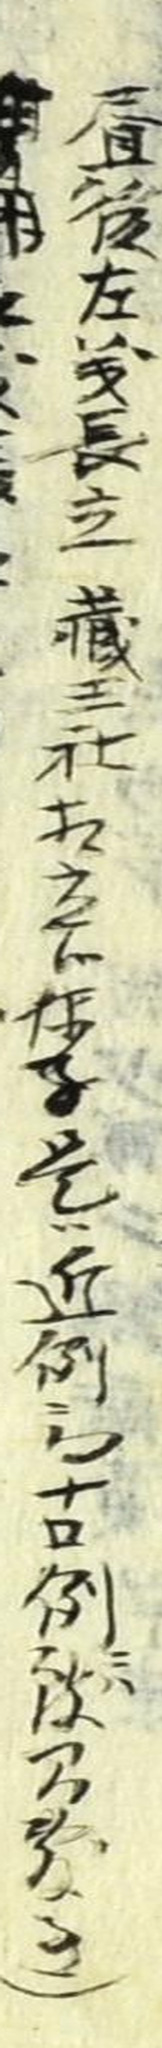昼後左義長立蔵王社相立候様子是ハ近年ニ而古例「ニハ」致間敷事也
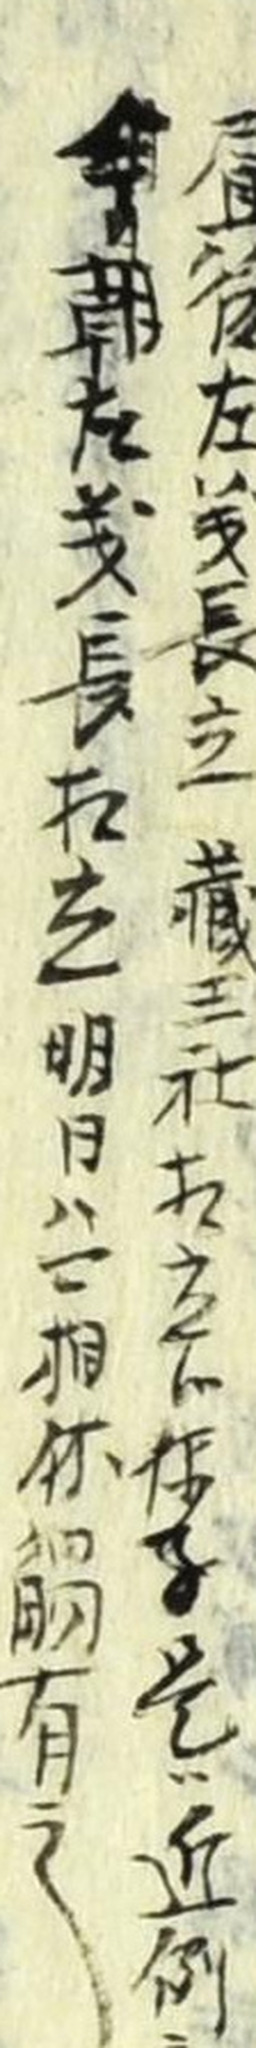今朝左義長相立明日ハ可相休触有之
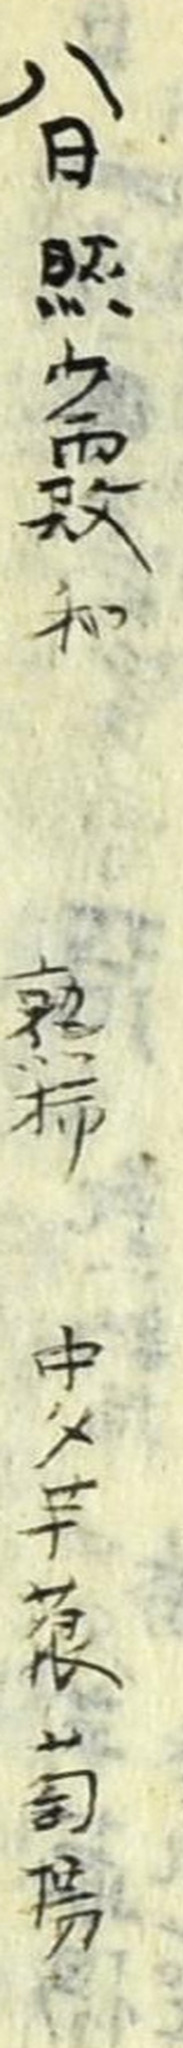八日照少霰和熟柿中夕芋菔萄揚
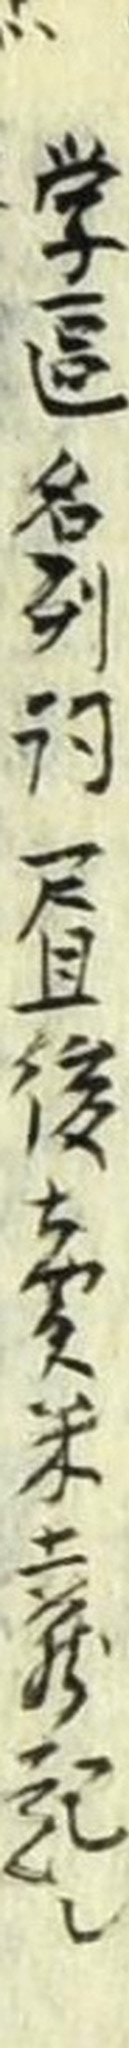学区名列調昼後売米土蔵起シ
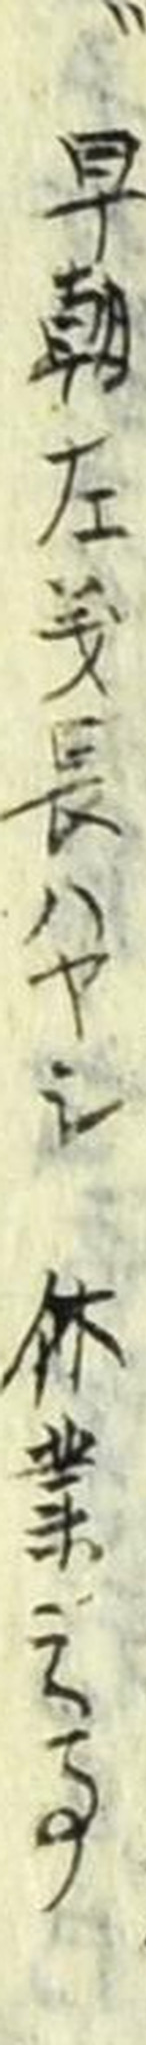早朝左義長ハヤシ休業之事
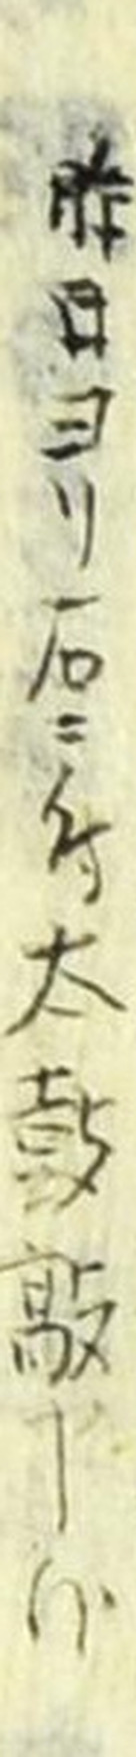昨日ヨリ右ニ付太鼓敲申候
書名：（日記）
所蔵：福井県文書館 Fukui Prefectural Archives
